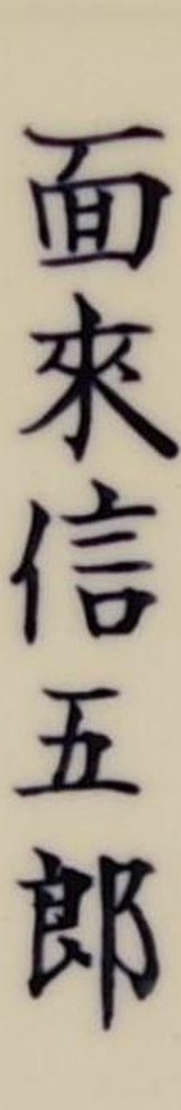面来信五郎
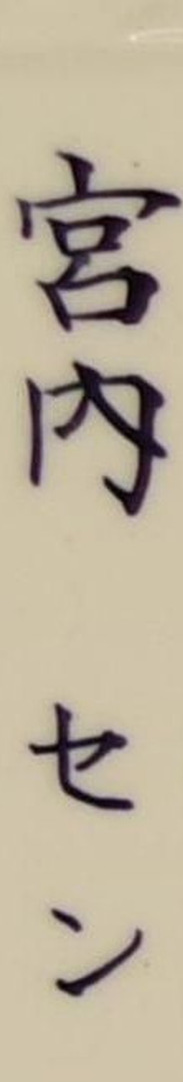宮内セン
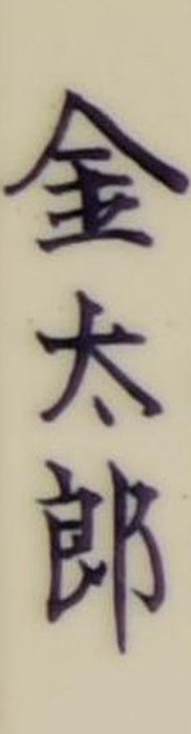金太郎

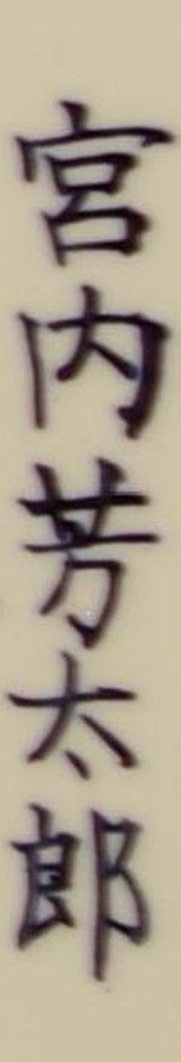宮内芳太郎
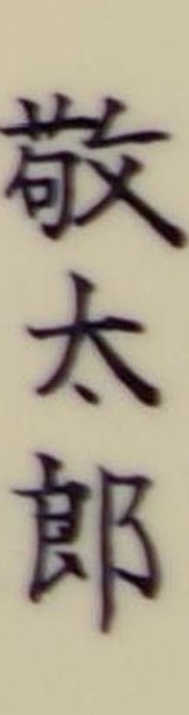敬太郎
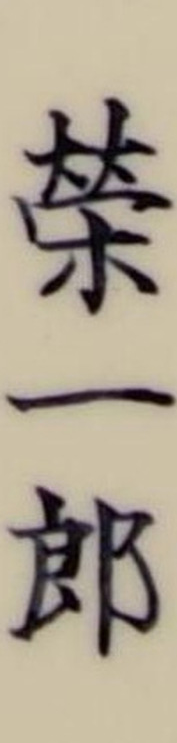榮一郎
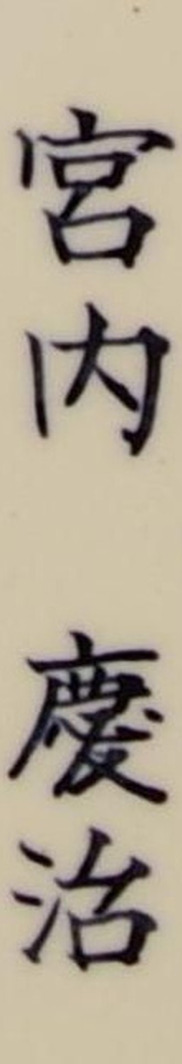宮内慶治
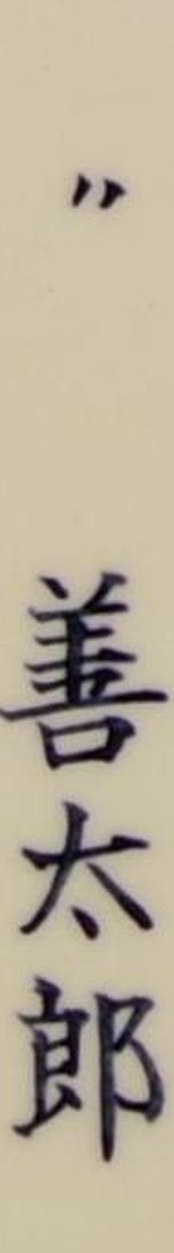善太郎
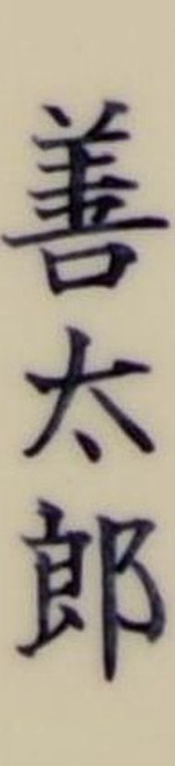善太郎
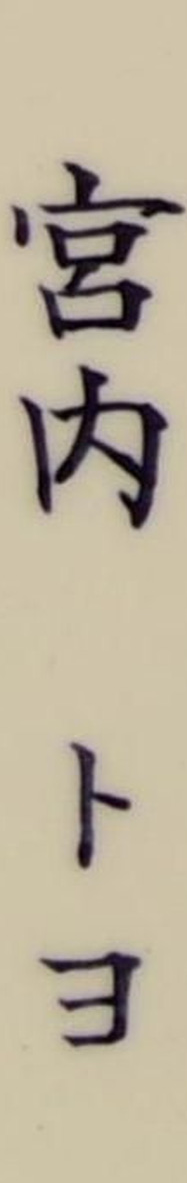宮内トヨ
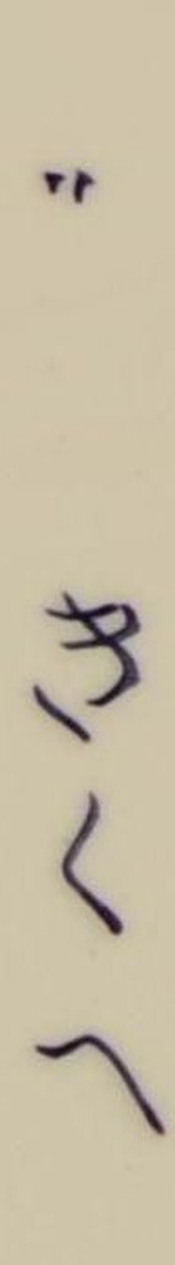きくへ
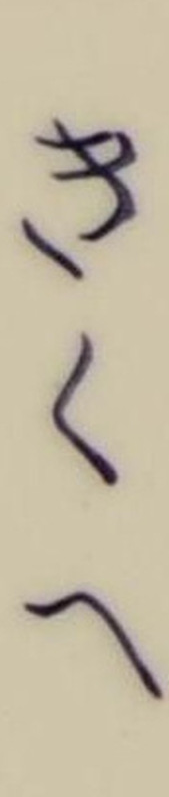きくへ
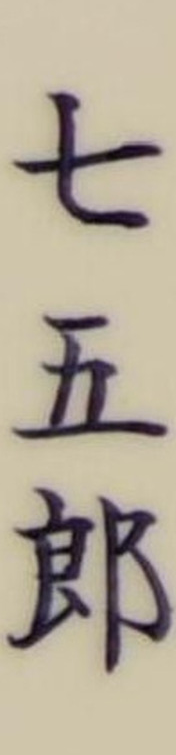七五郎

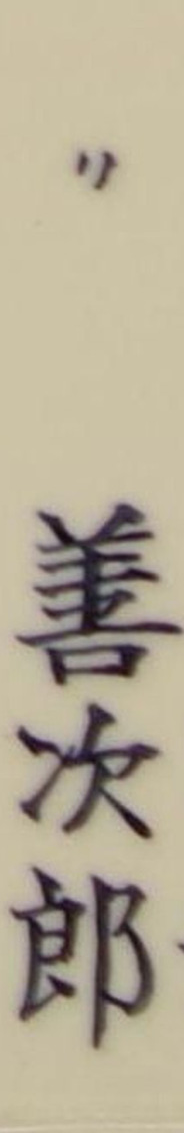善次郎
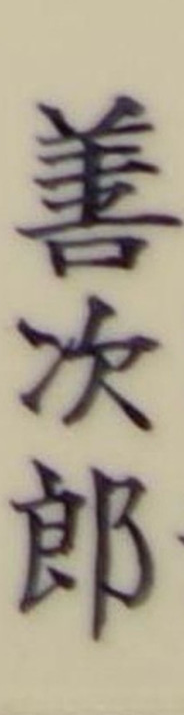善次郎
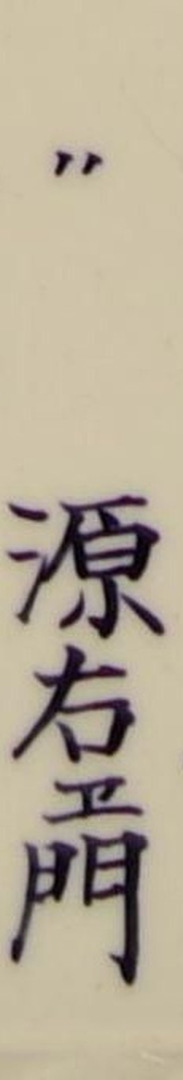源右ヱ門
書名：E~L
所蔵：高野山金剛峯寺
